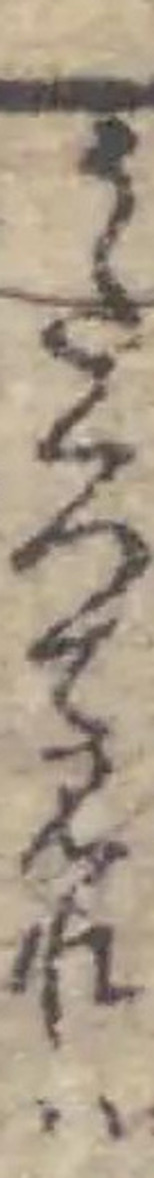うたくつて見れは
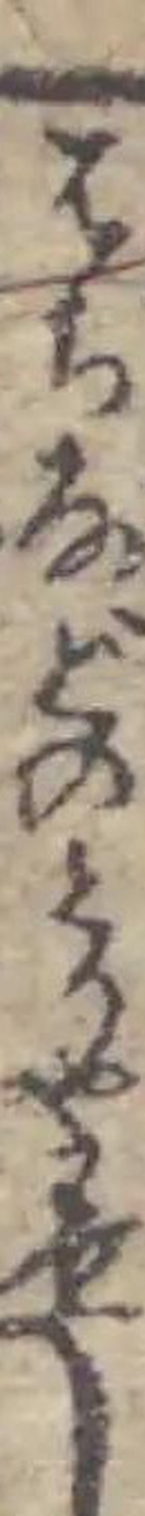はちなどのとりやわせ
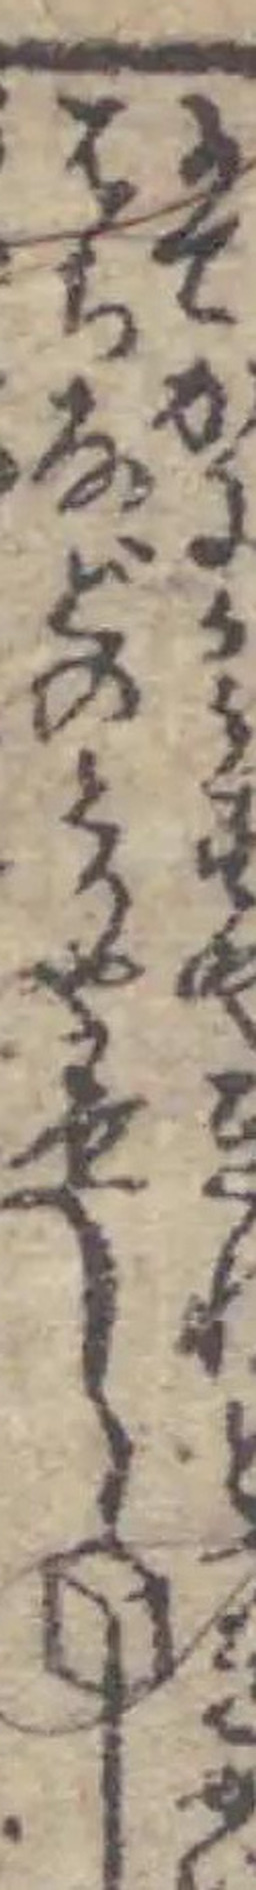はちなどのとりやわせ
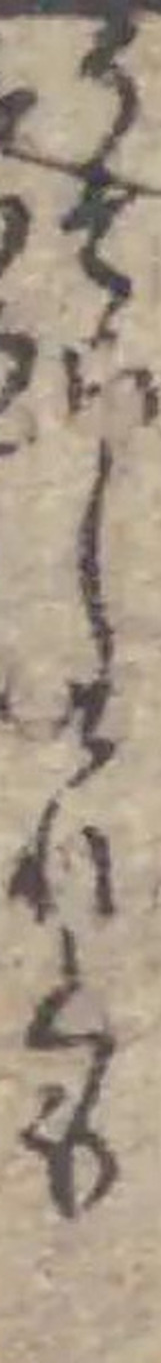うそらしけれとも
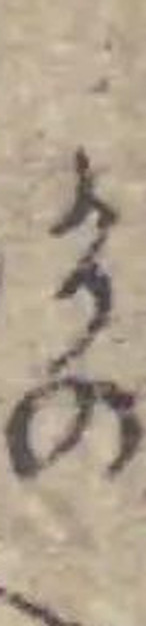よりの
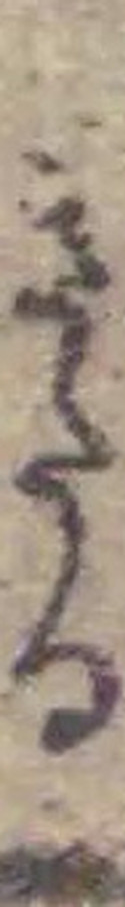きたる
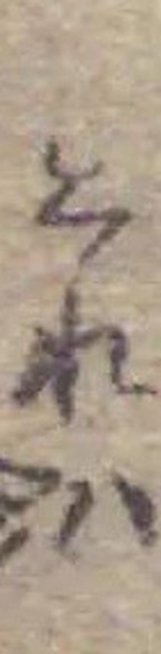これは
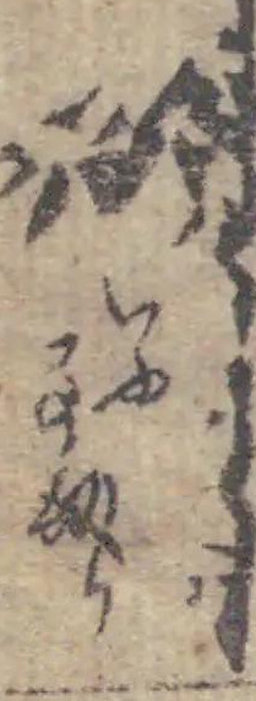事成り
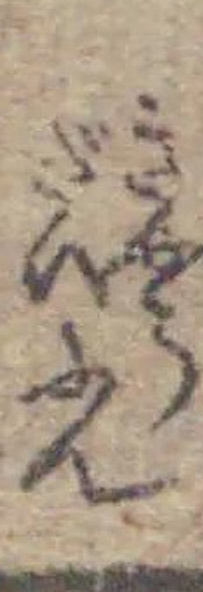だいふん

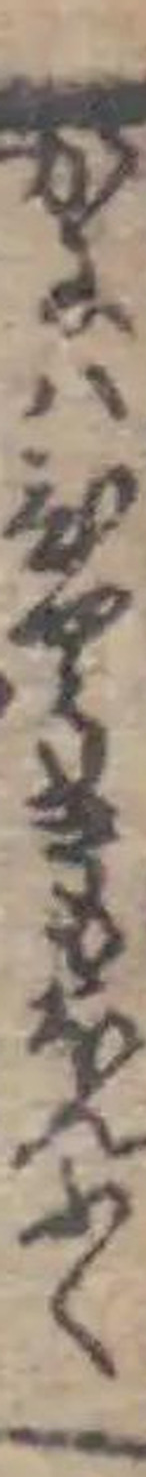かにはひやうきもほんふく
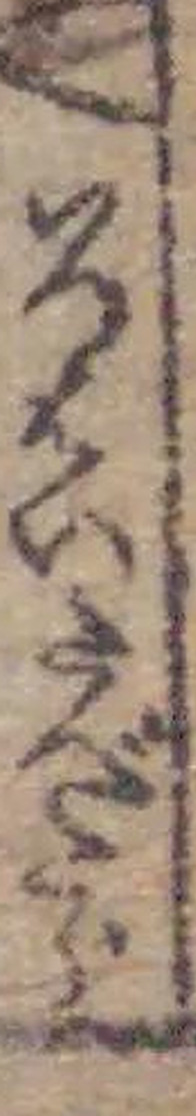いつはいたべたら
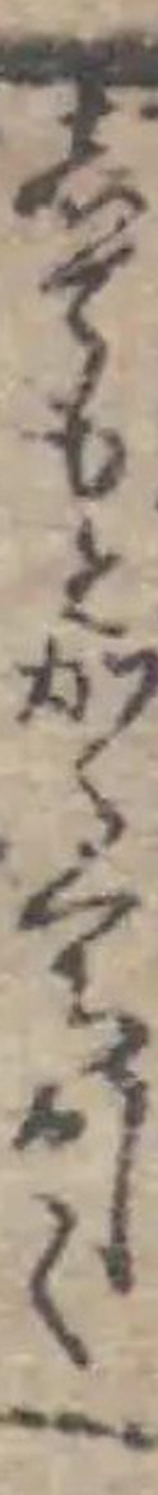してもとかくくちおしく
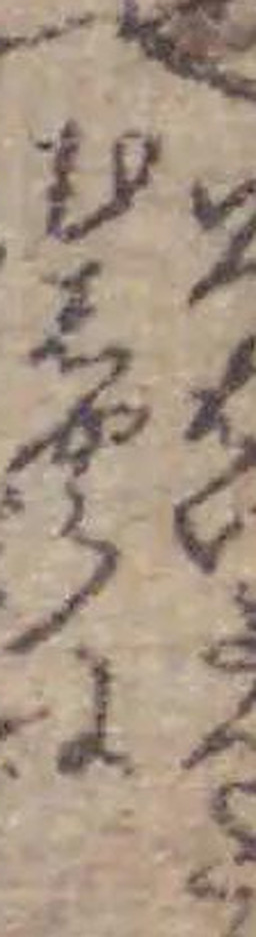むしやうに
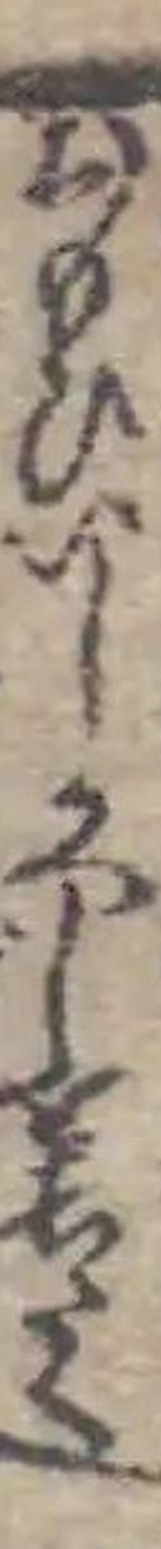おもひいしかへしをしたく
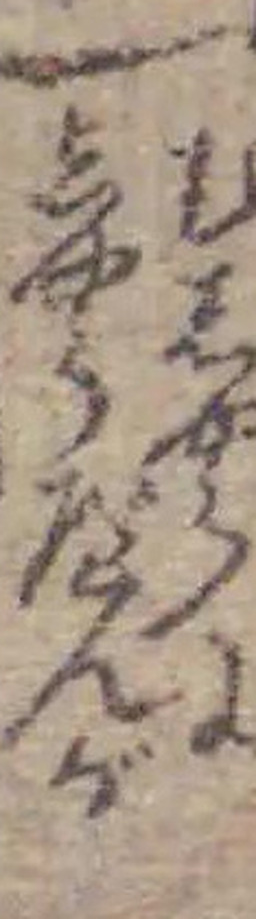しやうべんが
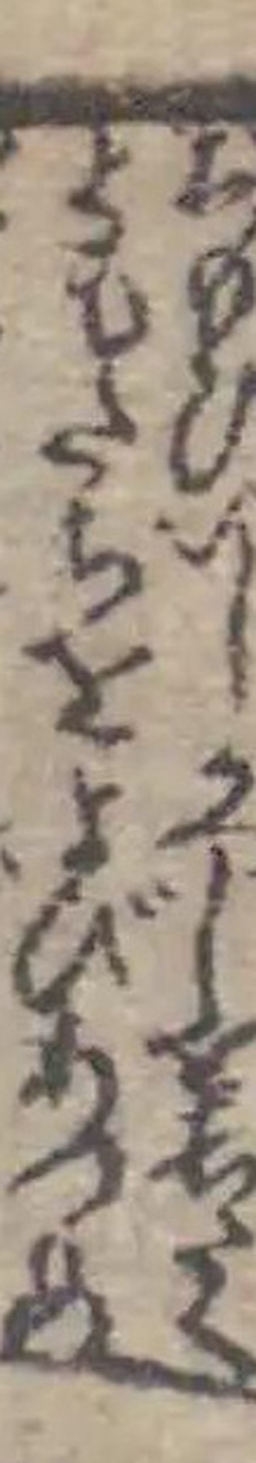ともたちをよびあつめ
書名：蟹牛房挟多 3巻
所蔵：国立国会図書館 National Diet Library, JAPAN
